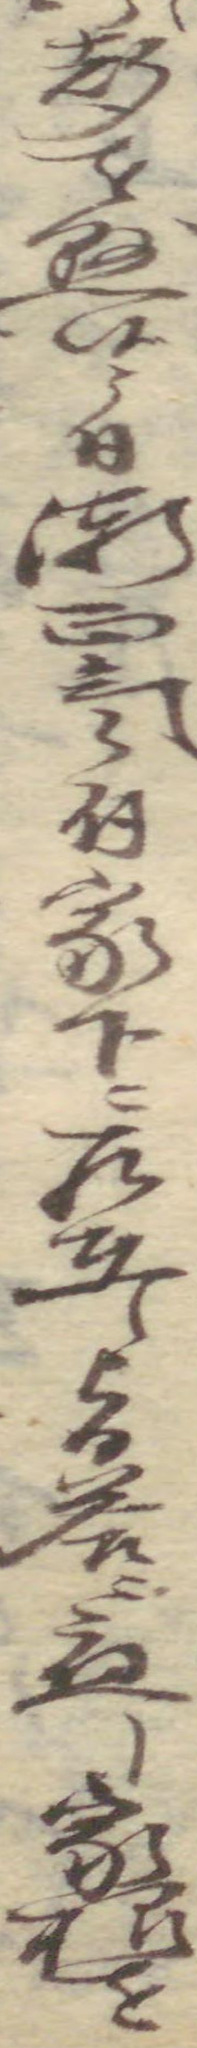声を懸候ニ付漸正気付家下ニ罷在候旨答ニ応し家根を
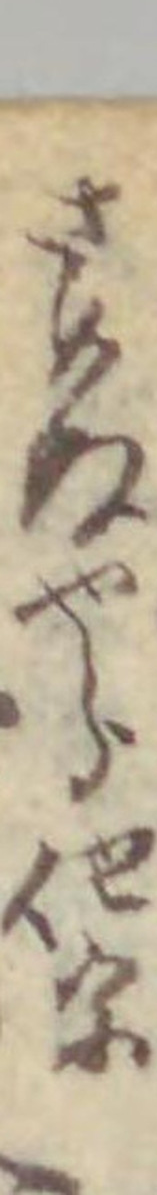さめぬやら他宗
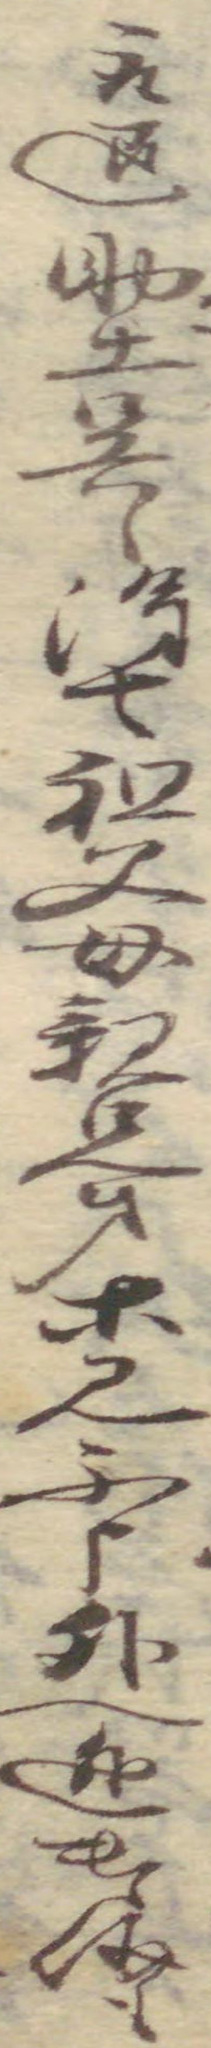取退助出呉候得は祖父母親兄弟等見不申外へ逃出候儀も
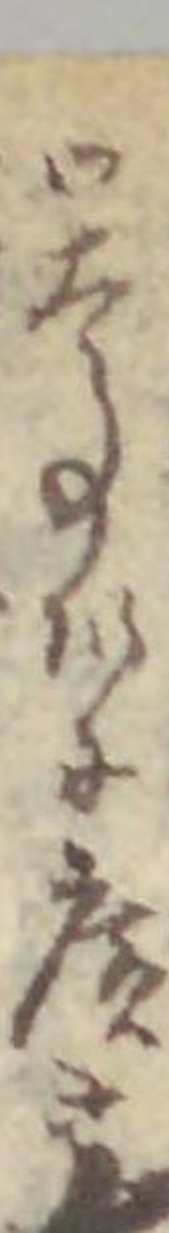御大事故に広き
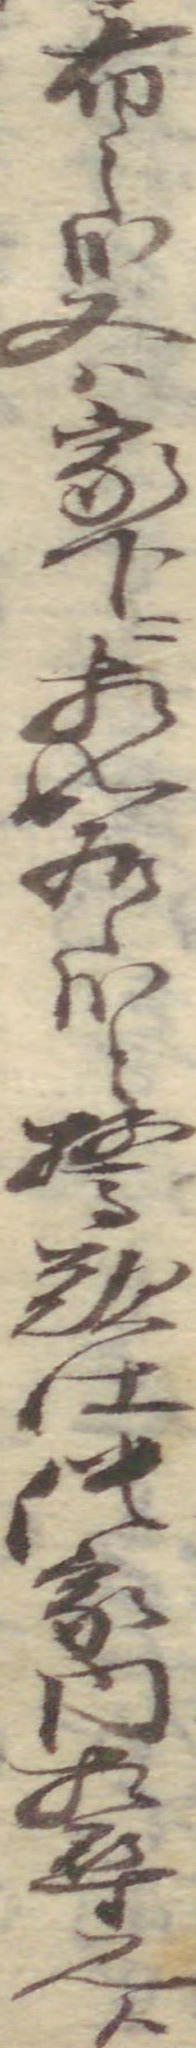有之哉又ハ家下ニ相成居候哉と驚歎仕潰家内相尋見候
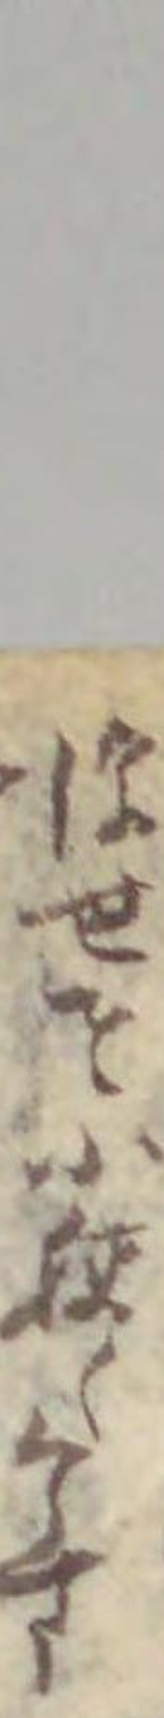浮世を小狭くくらす
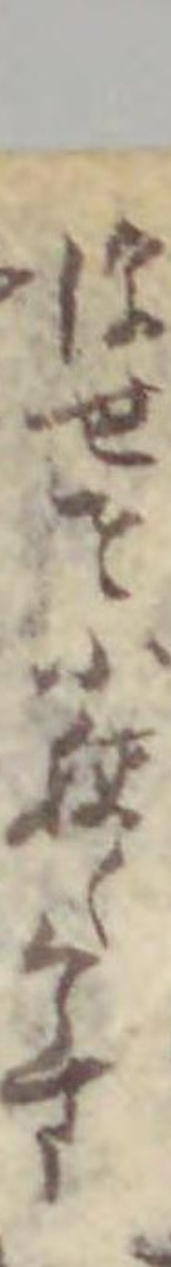浮世を小狭くくらす
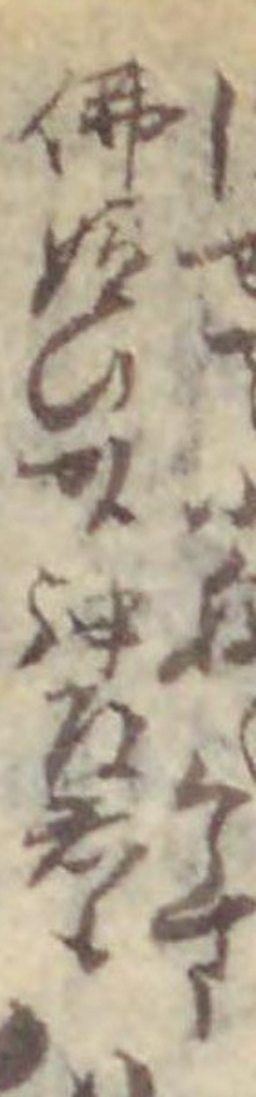仏嫌ひな神道者も
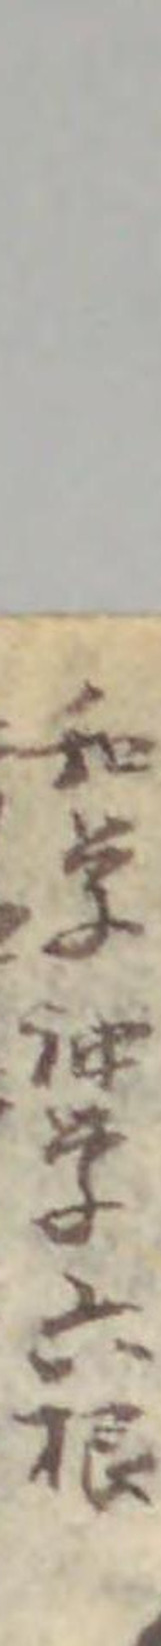和学神学六根
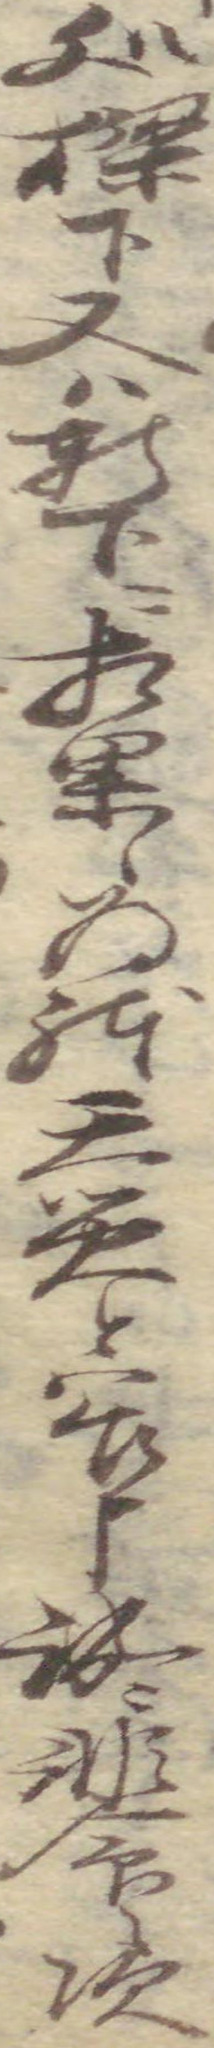処梁下又ハ軒下ニ相果候為体天災とハ乍申誠ニ非命之次
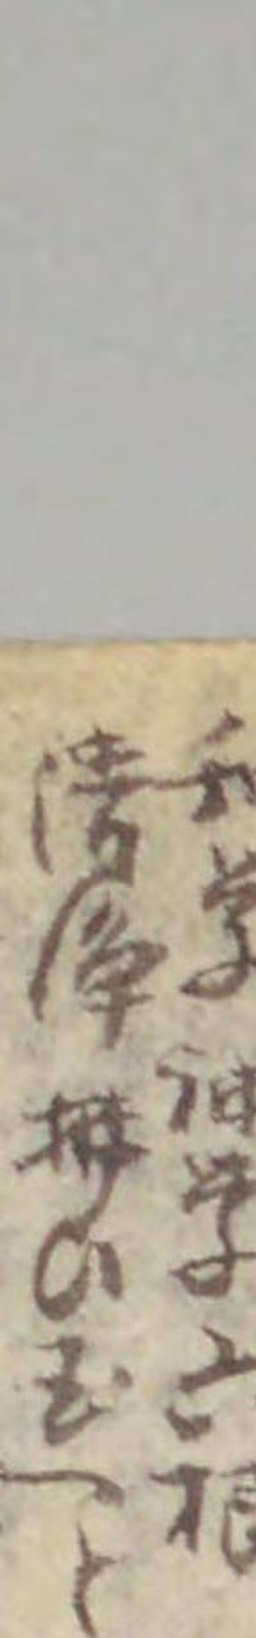清浄払ひ玉へと
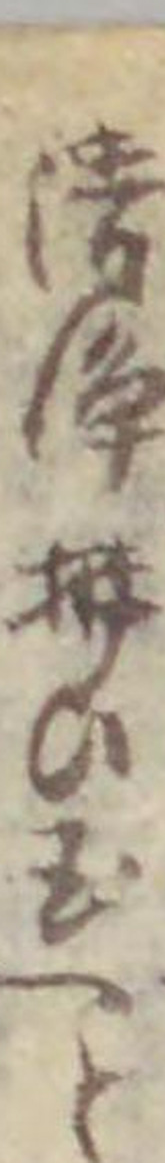清浄払ひ玉へと
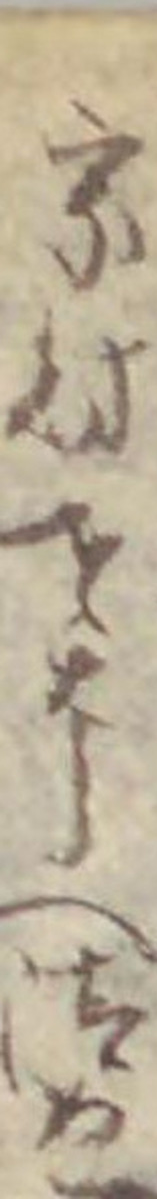家財をはらへ清め
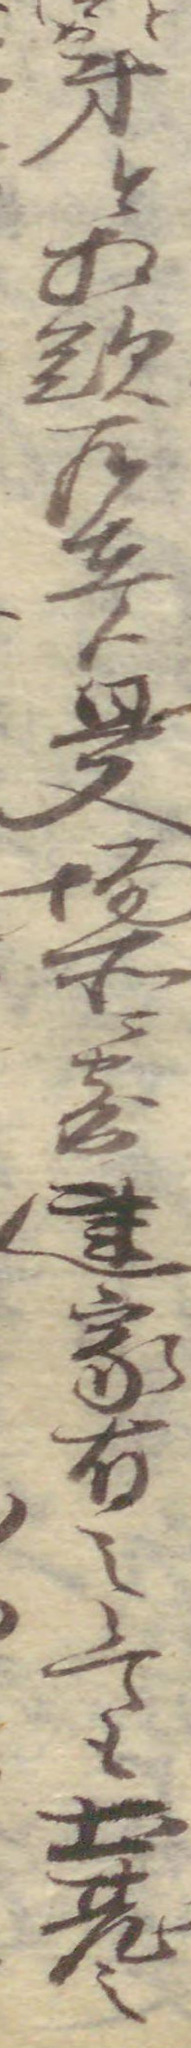第と相歎罷在候且又場所ニ寄建家有之候ても土台之
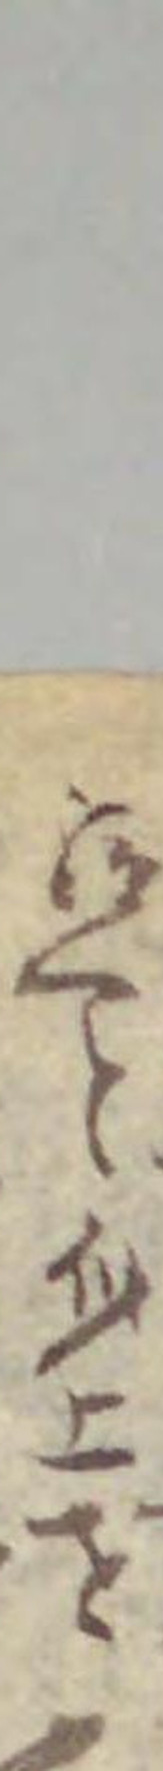給へと身上を
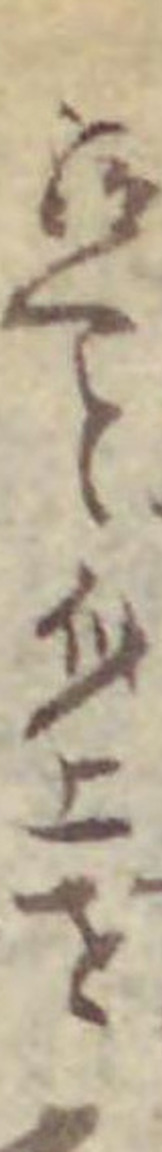給へと身上を
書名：鶯宿雑記. 巻199-200
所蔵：国立国会図書館 National Diet Library, JAPAN
